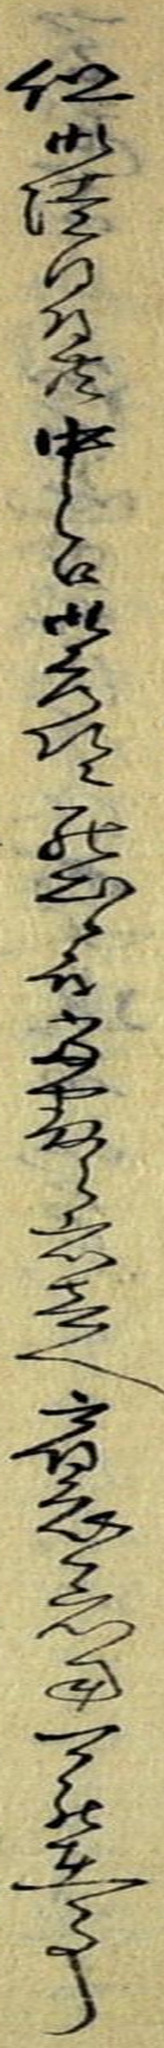但御徒目付共中之口御取次に罷出候に付当番之者壱人肩衣着用可罷在事
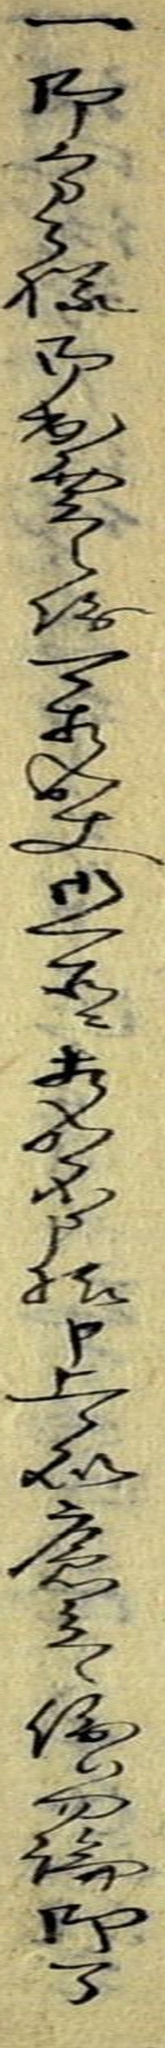一御方々様御出殿之儀可相成丈御一所に相成不申様申上候処廉立候儀は勿論御了
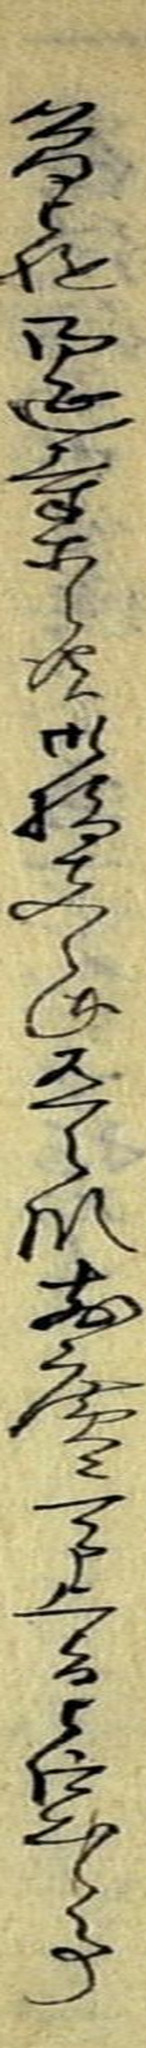簡被遊御延気等之儀は御指支之趣有之段於廣に可申上旨被仰出候事
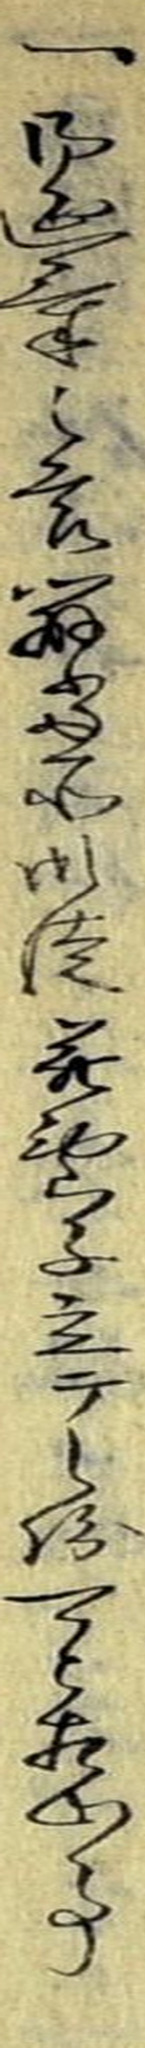一御延気之節弁当所御徒并台子立テ之儀可被相止事
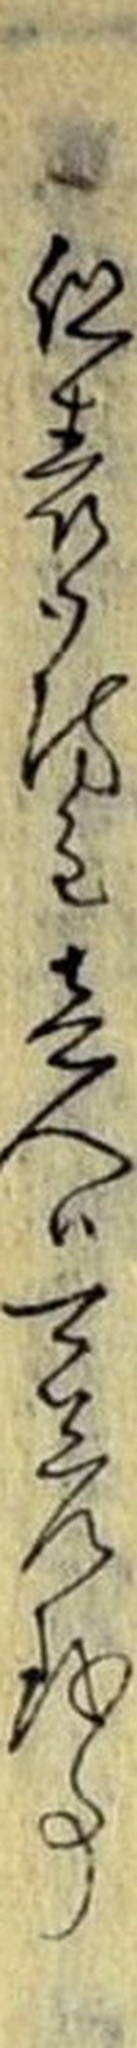但表御坊主壱人は可差越事
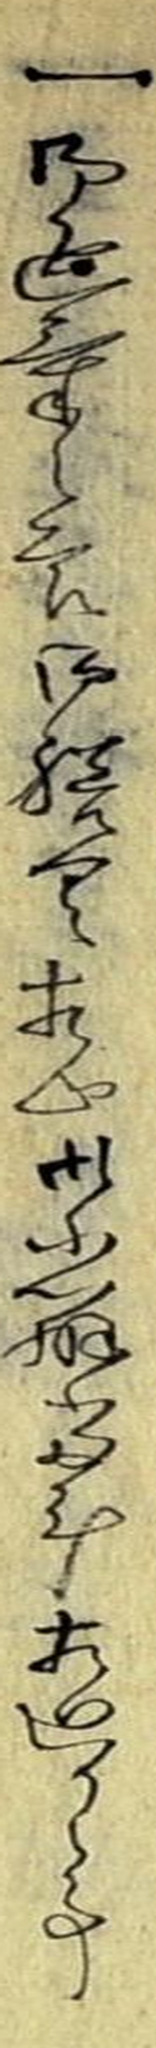一御延気之節御膳具相止御小弁当斗相廻り候事
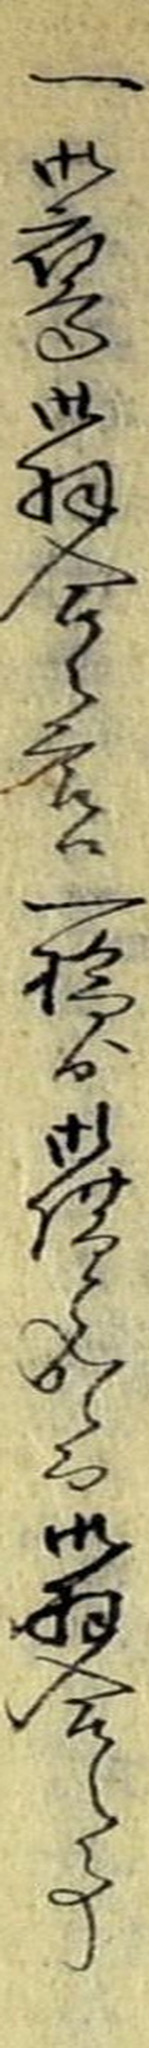一御鷹御羽合之節は一橋ゟ御借被成候而御羽合之事
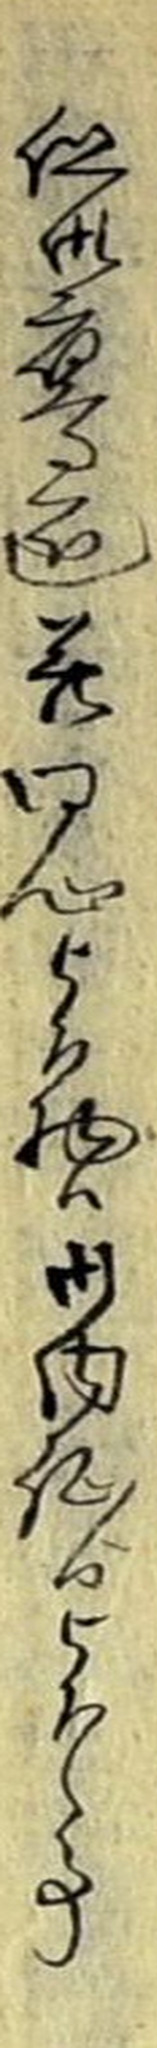但御鷹匠并同心被下物は御内証ゟ被下候事
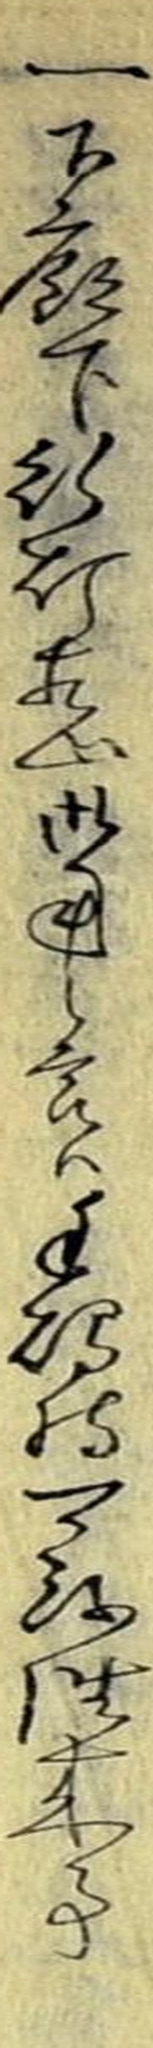一下廊下行灯相止御用之節は手燭持可致往来事
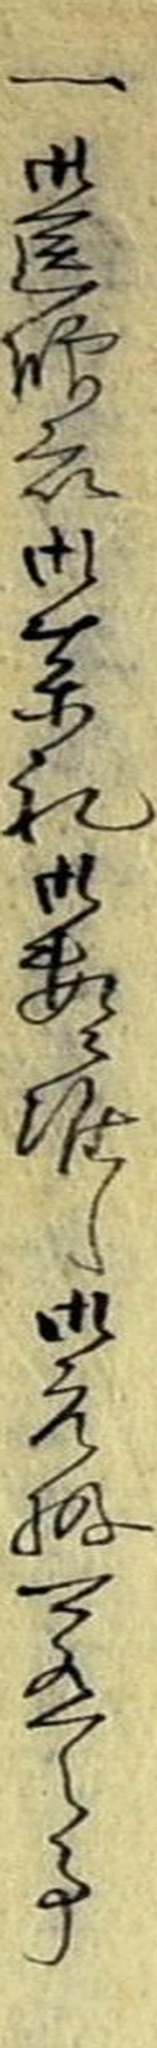一御医師衆御薬礼御段に准し御取扱可有之事
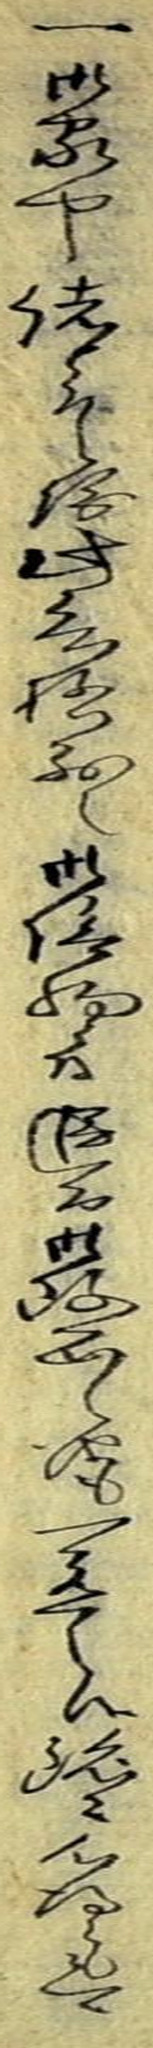一御家中諸被下儀此度格別之御倹約に付追而御改正之儀も可有之候銘々心得にも可
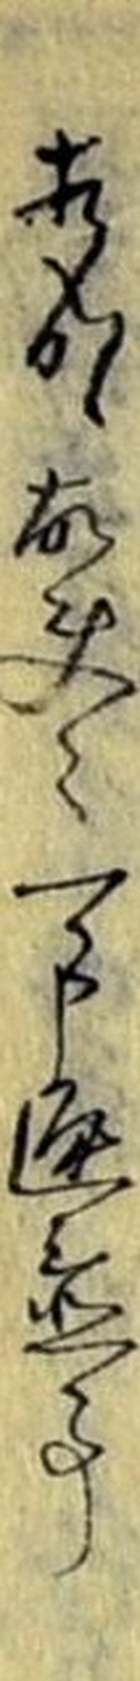相成候故夫々可申通置事

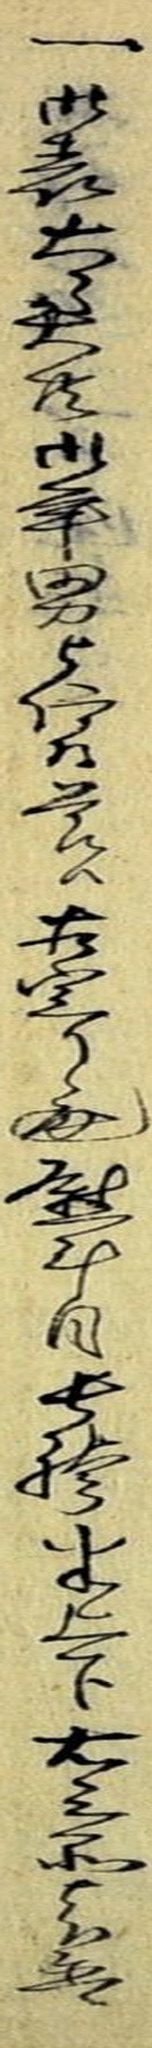一御表大奥共御年男被仰付節は相定り通熨斗目長袴半上下右三品被下置候
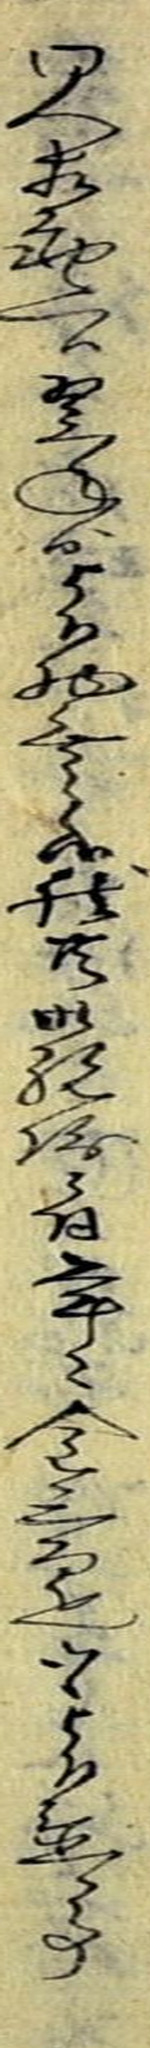同人相勤候へは翌年ゟ被下物無之候然共御祝儀に付年々金三百疋つヽ被下置候事
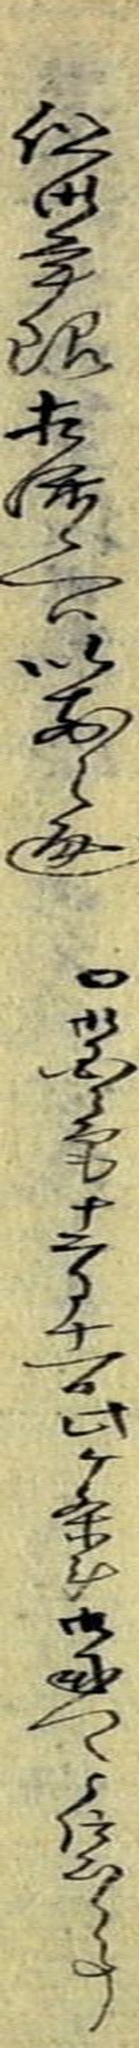但御年限相済候へは以前之通○御国に而も十二月十一日此ヶ条斗御用人へ被仰出候事
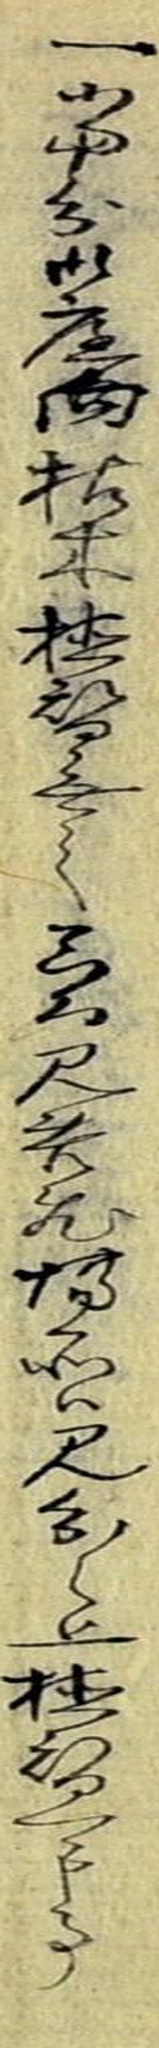一当分御庭内枯木植替無之至而見苦敷場所は見分之上植替可申事
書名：命令之部 四
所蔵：福井県文書館 Fukui Prefectural Archives
